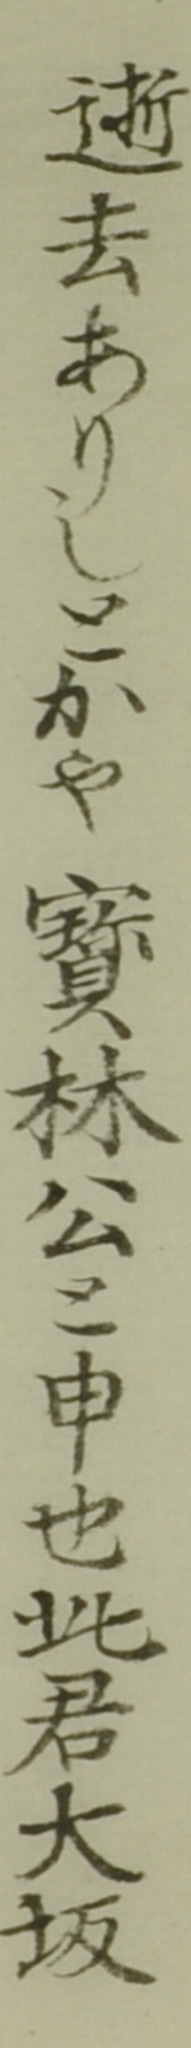逝去ありしとかや宝林公と申也此君大坂
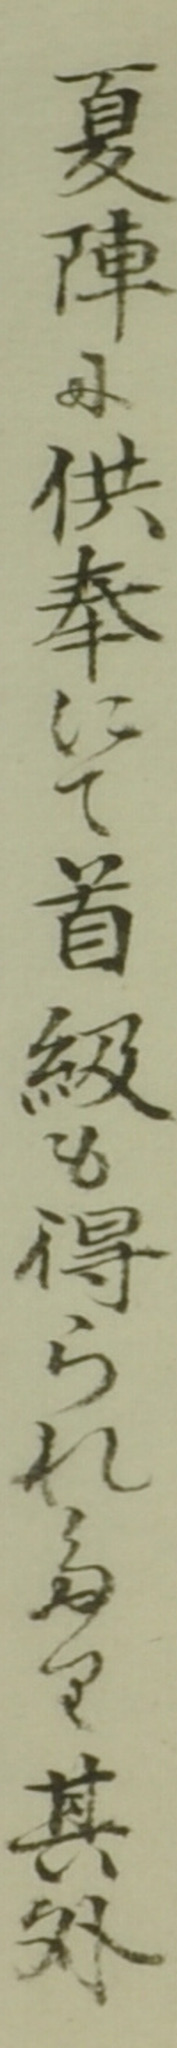夏陣に供奉にて首級も得られたり其外
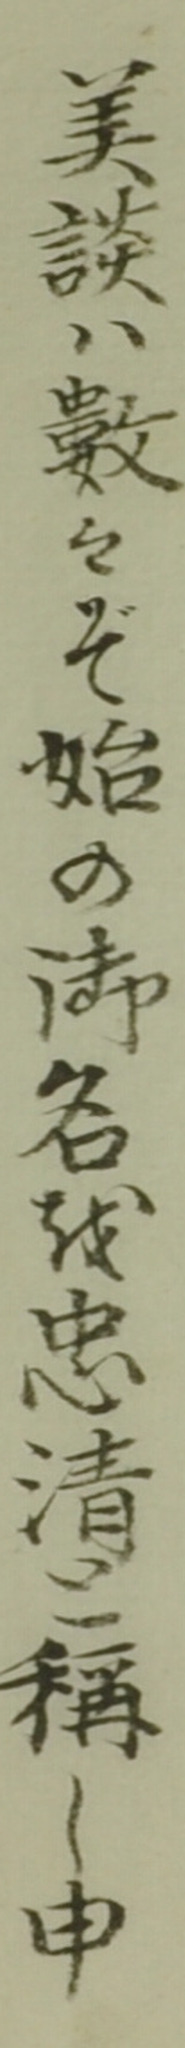美談は数々ぞ始の御名を忠清と称し申
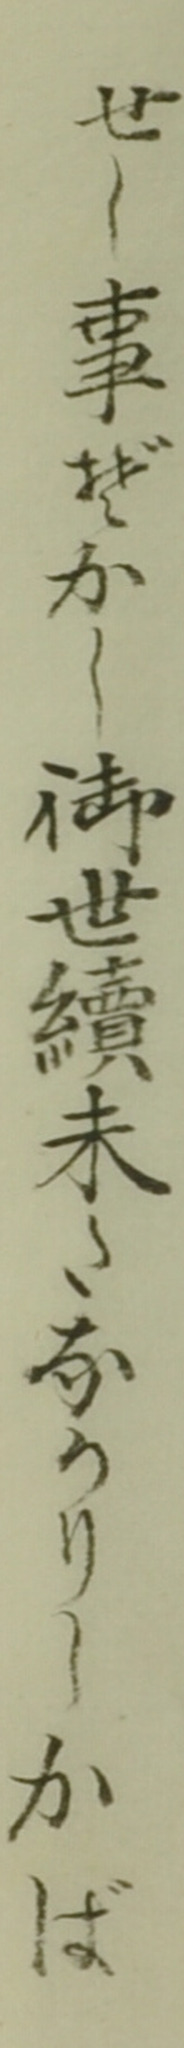せし事ぞかし御世続未たなかりしかば

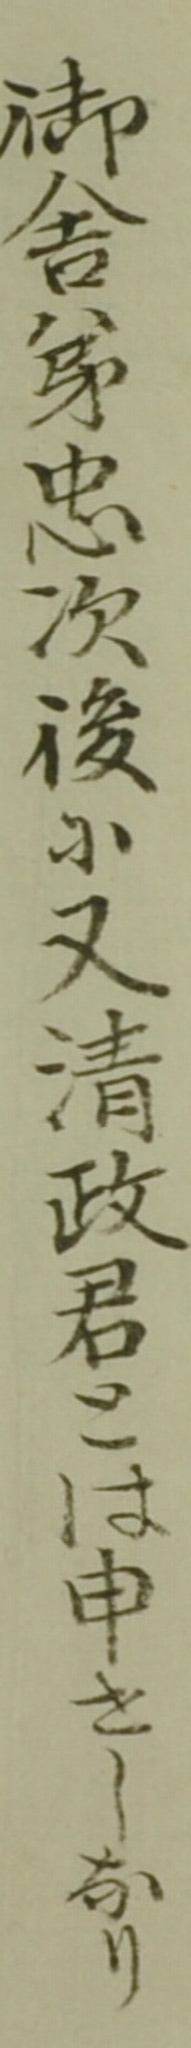御舎弟忠次後に又清政君とは申せしなり
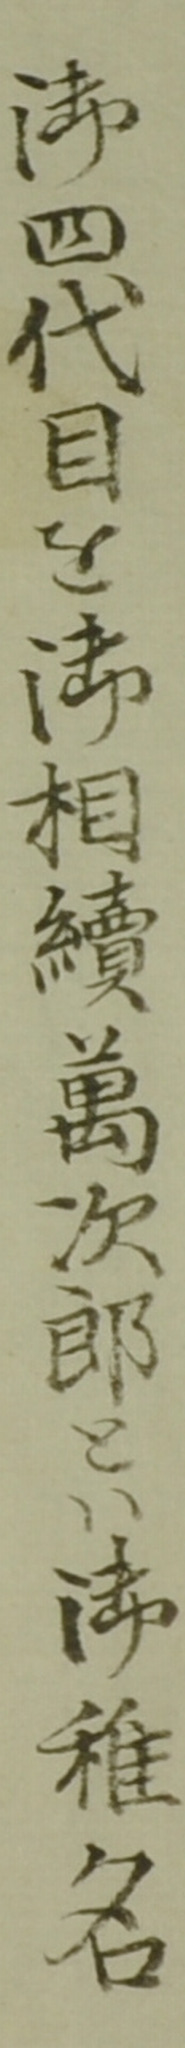御四代目を御相続万次郎とは御稚名
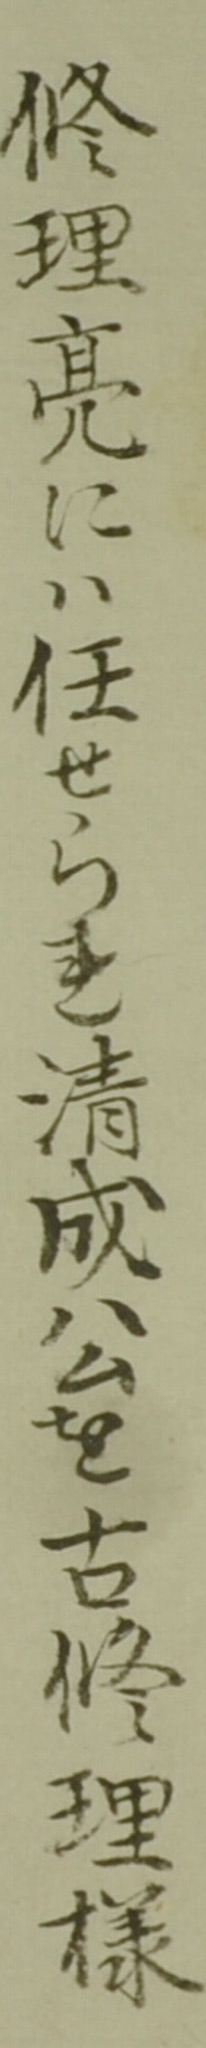修理亮には任せられ清成公を古修理様
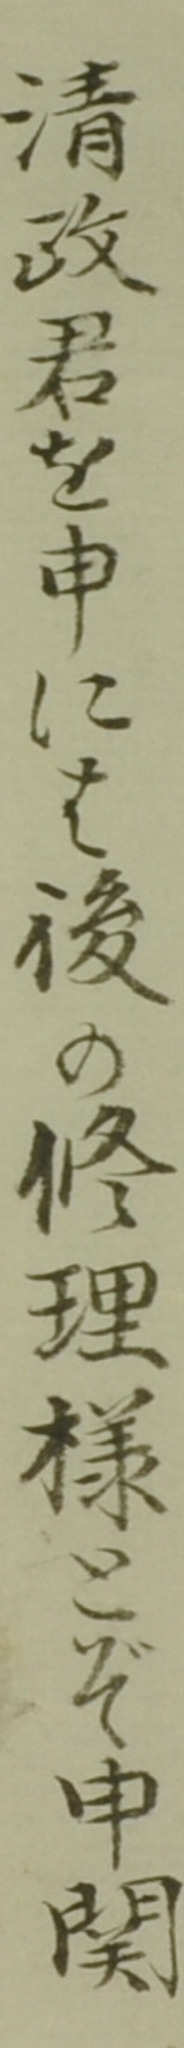清政君を申には後の修理様とぞ申関
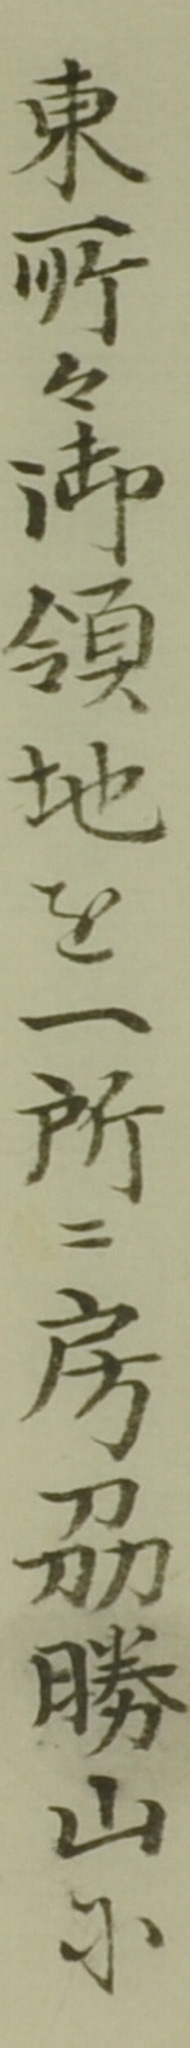東所々御領地を一所に房州勝山に
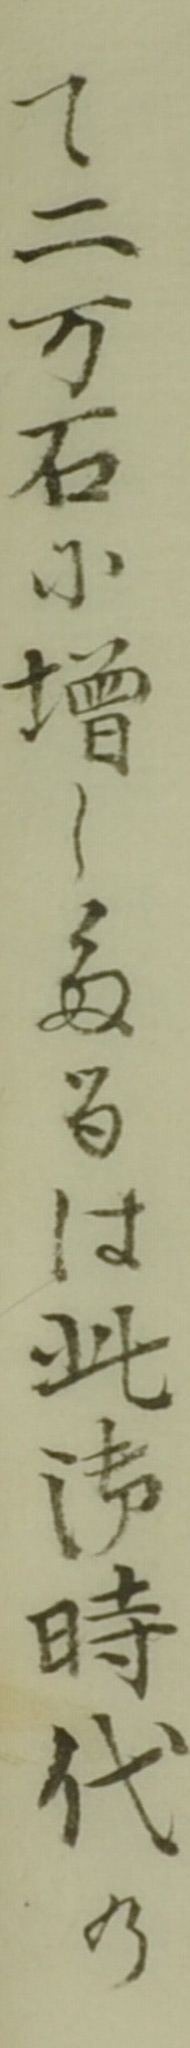て二万石に増したるは此御時代の
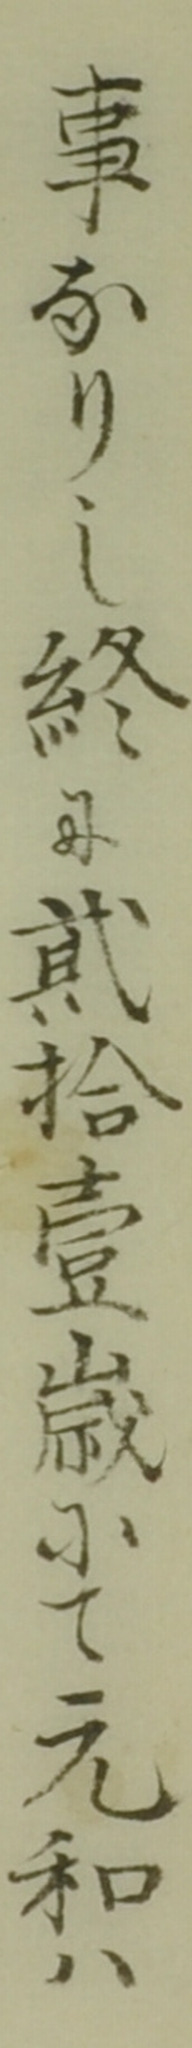事なりし終に貮拾壱歳にて元和は
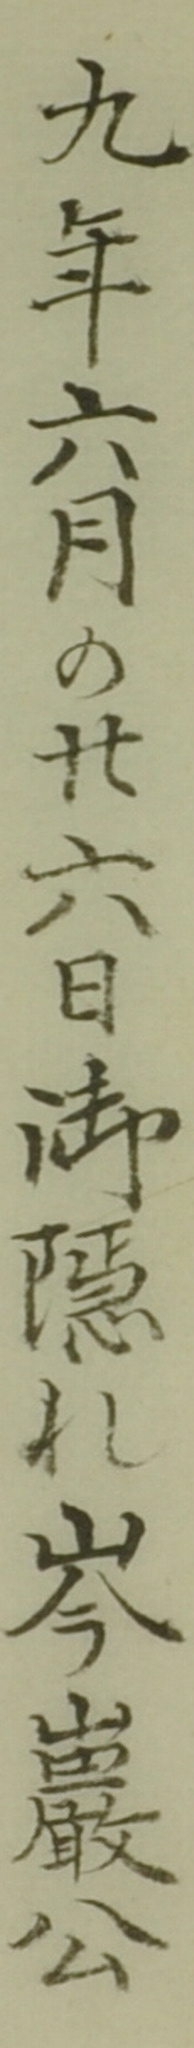九年六月の廿六日御隠れ岑巌公
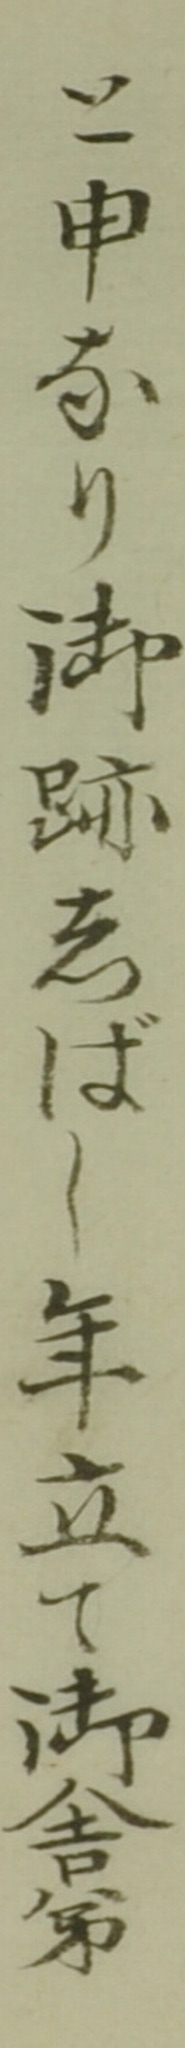と申なり御跡しばし年立て御舎弟
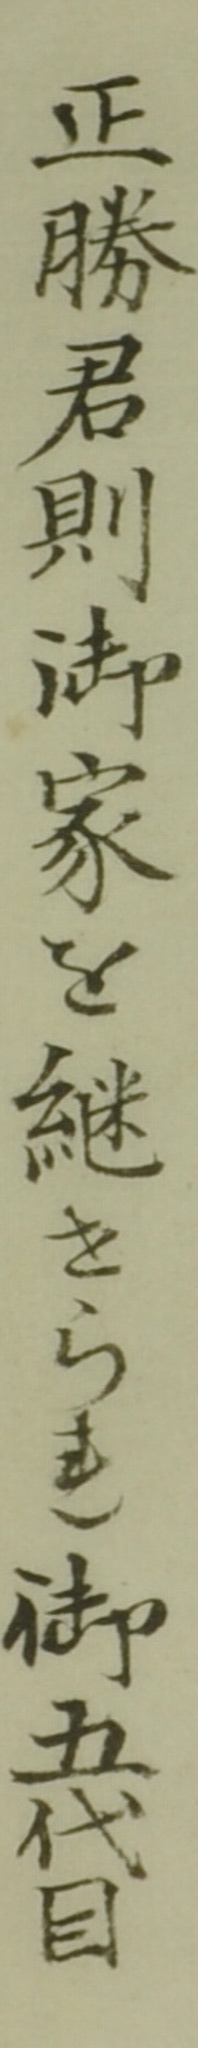正勝君則御家を継せられ御五代目
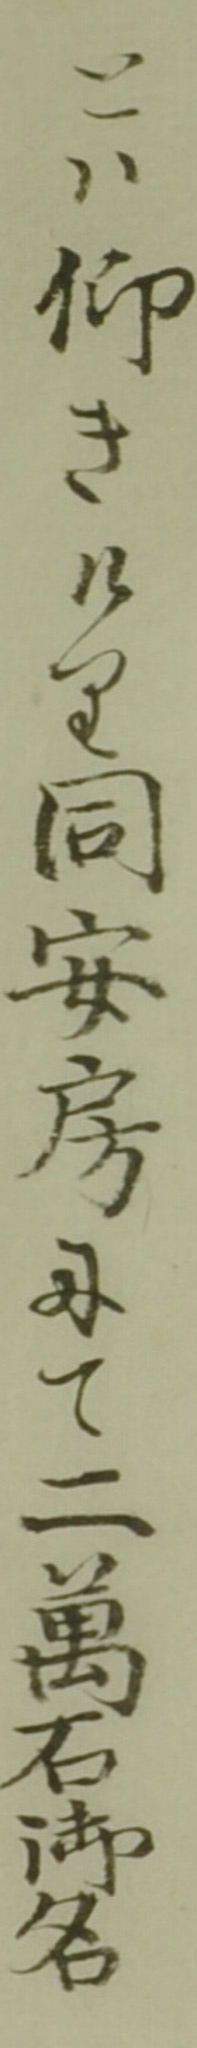とは仰きけり同安房にて二萬石御名
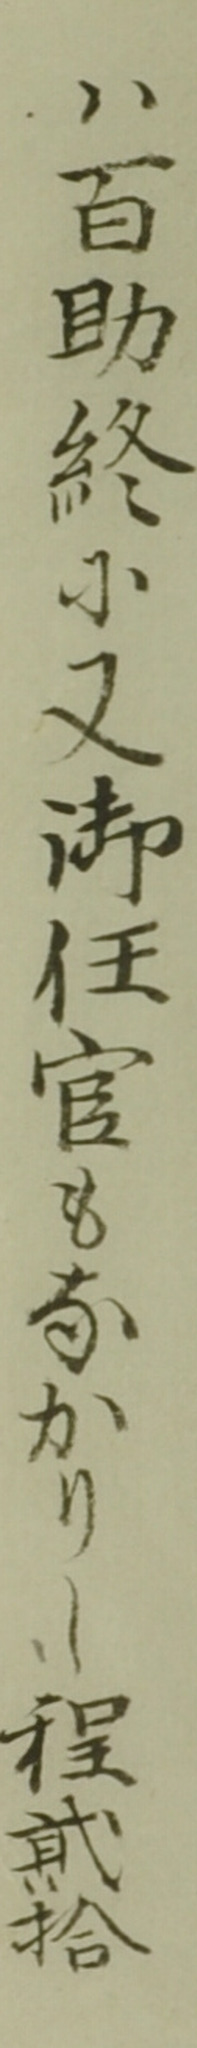は百助終に又御任官もなかりし程貮拾
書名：藤葛（全）
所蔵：伊那市立高遠町図書館・合同会社AMANE
